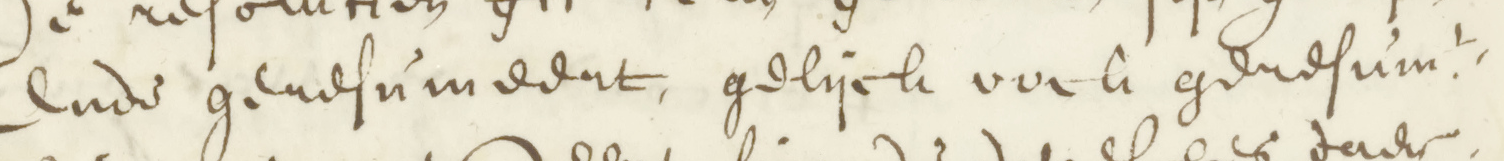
Ende geresumeert, gelijck oock geresumt.
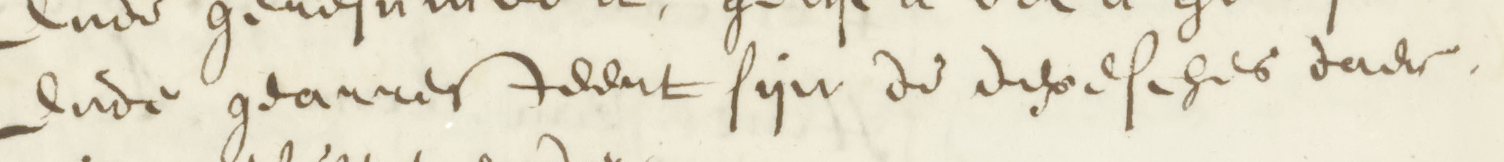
Ende gearresteert sijn de depesches daer
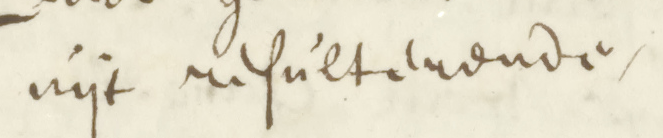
uijt resulterende.
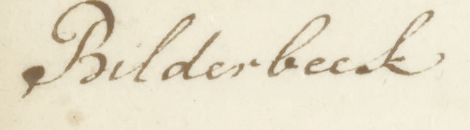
Bilderbeek
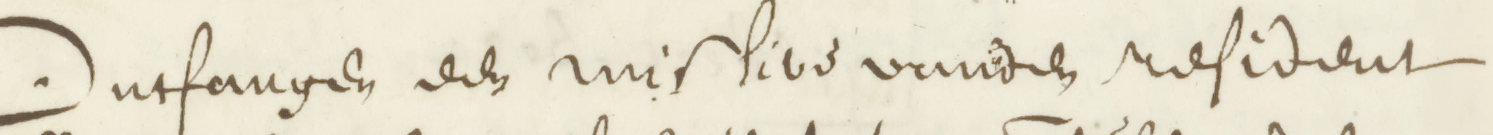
Ontfangen een missive vanden resident
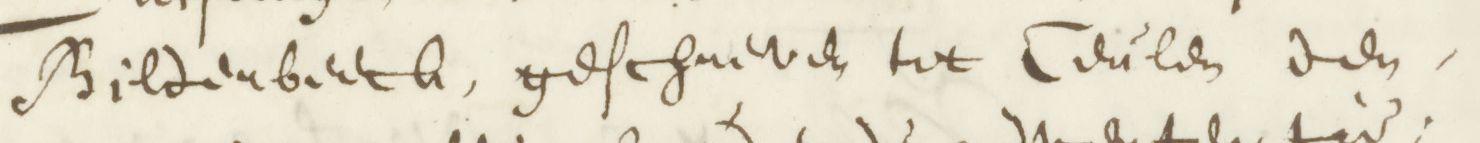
Bilderbeeck, geschreven tot Ceulen den
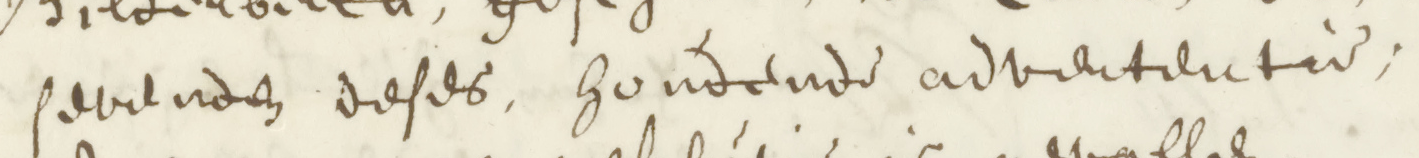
sevenden deses, houdende advertentie;
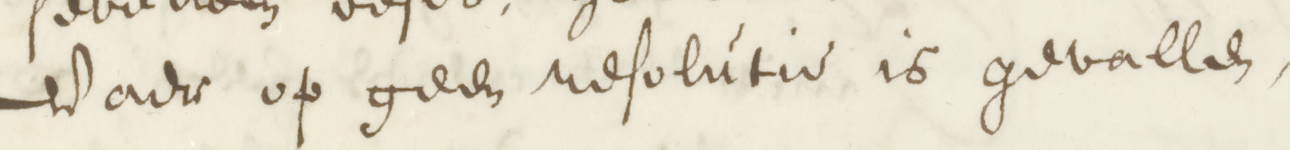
Waer op geen resolutie is gevallen.
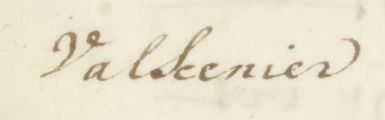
Valkenier
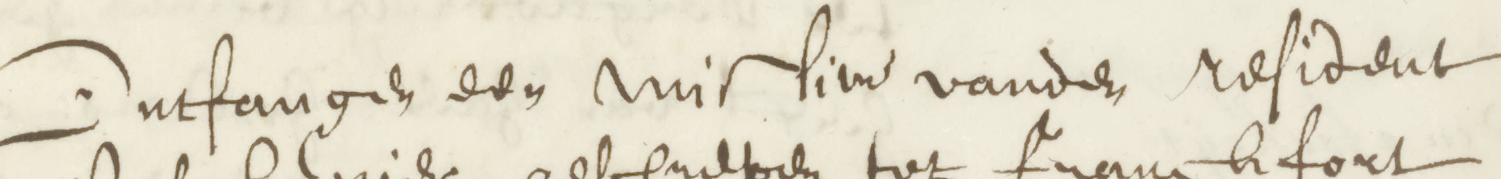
Ontfangen een missive vanden resident
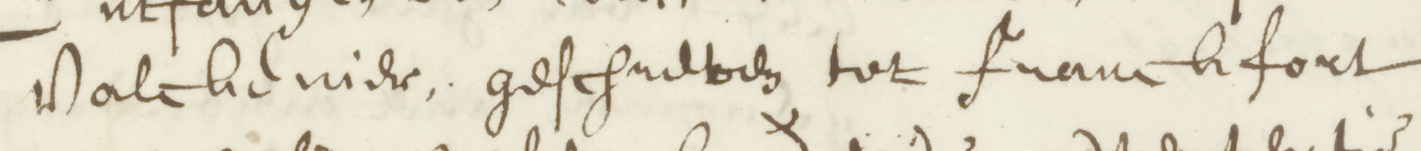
Valckenier, geschreven tot franckfort
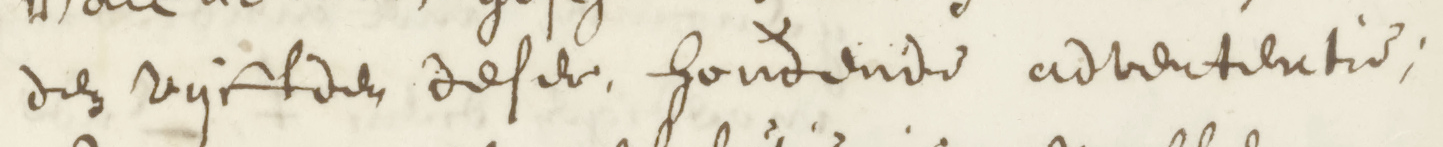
den vijffden deser, houdende advertentie;
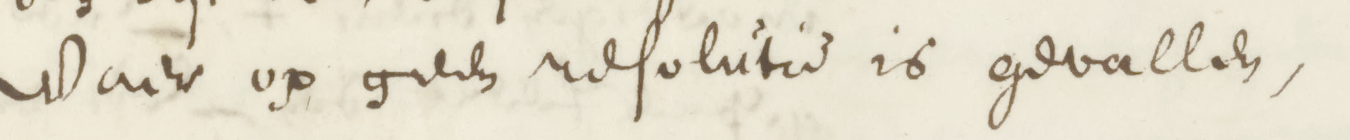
Waer op geen resolutie is gevallen.
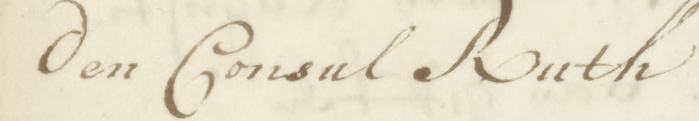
den Consul Ruth
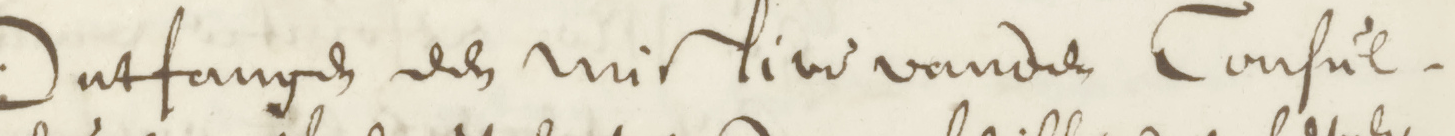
Ontfangen een missive vanden Consul
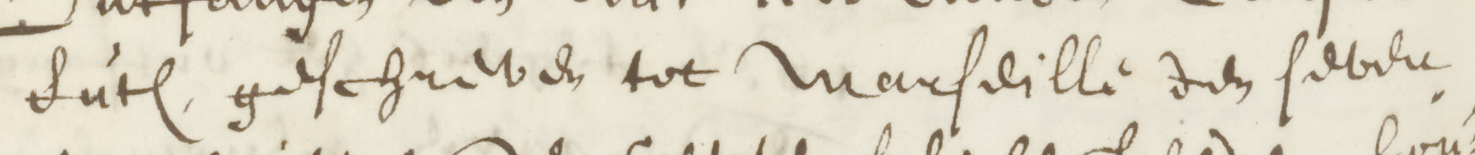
Ruth, geschreven tot Marseille den seven
